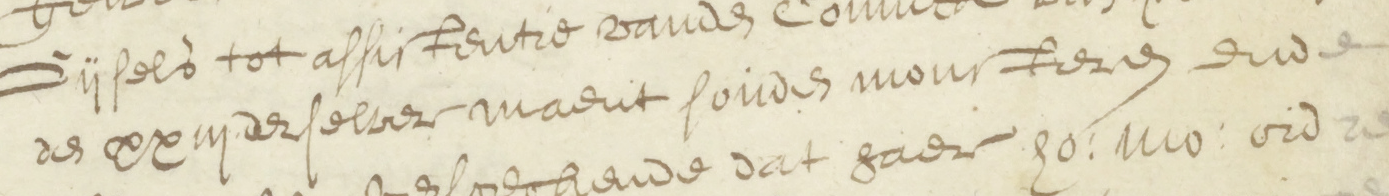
den xxiij derselver maent souden monsteren ende
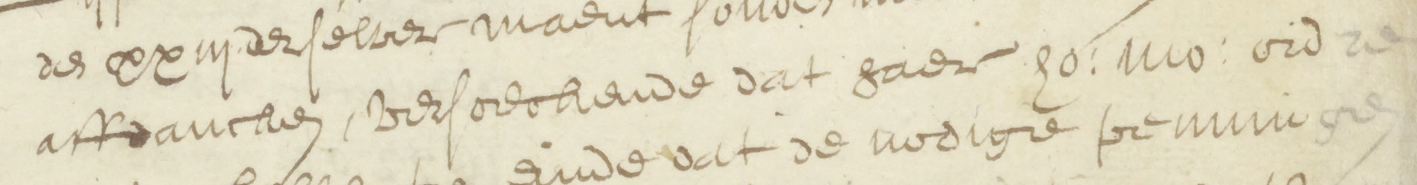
affdancken, versoeckende dat haer ho:mo ordre
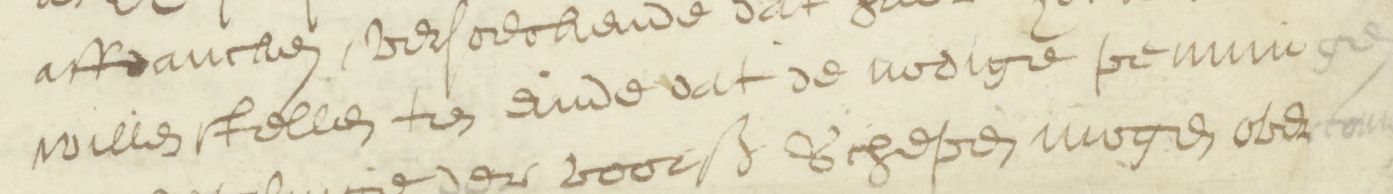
willen stellen ten einde dat de nodige penningen
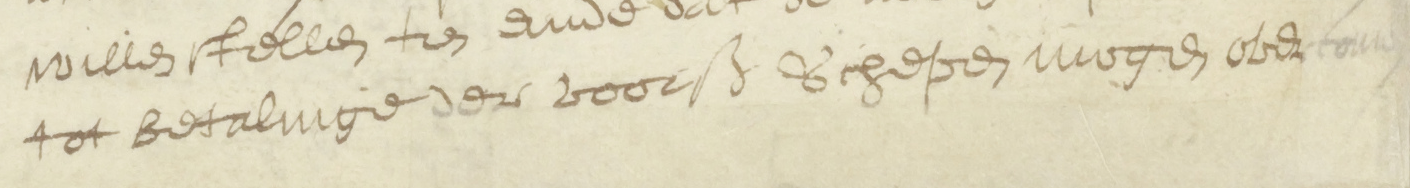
tot betalinge der voorsz Schepen mogen overcomen
